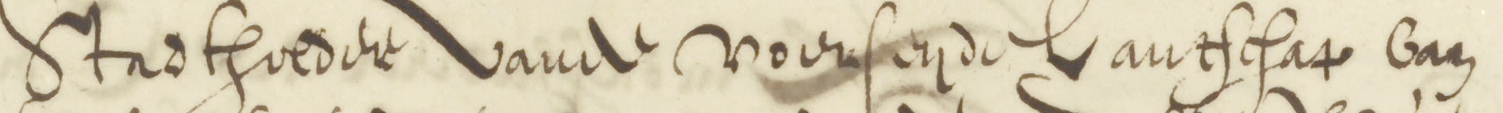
Stadtholder vande voerseyde Lantschap van
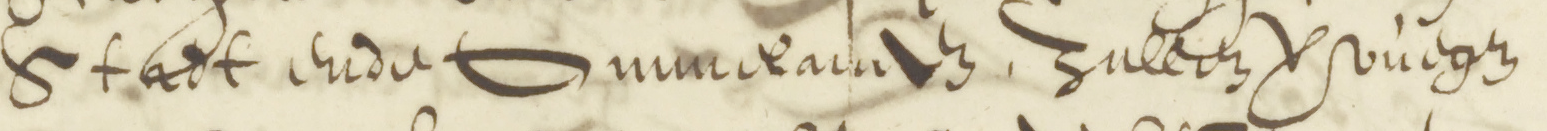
Stadt ende Ommelanden, zullen vvuegen
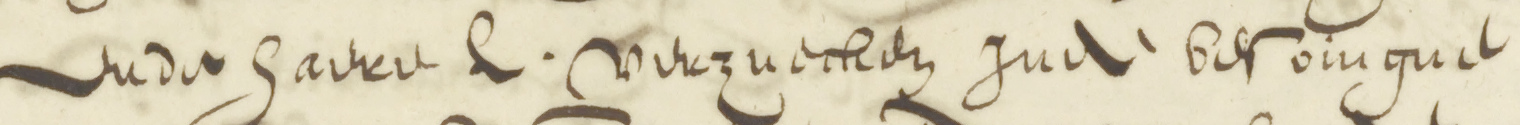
ende haere E. verzuecken Inde besoingne
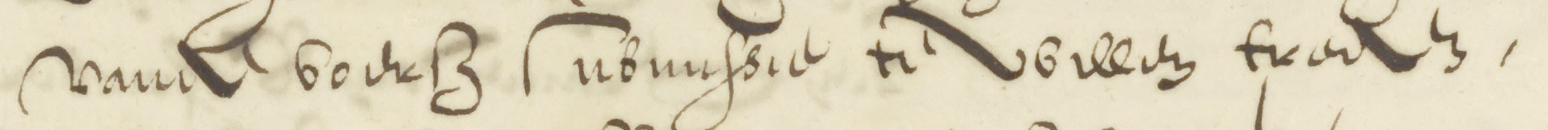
vande voers submissie te willen treden,
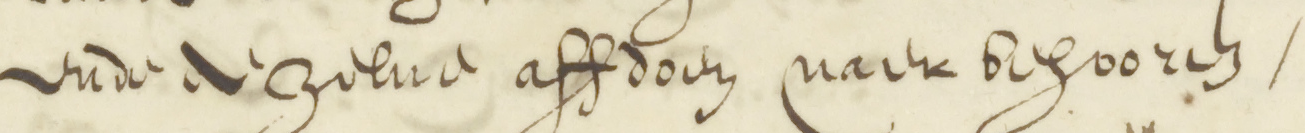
ende dezelue affdoen naer behooren.
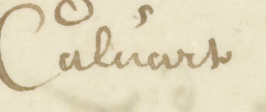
Caluart
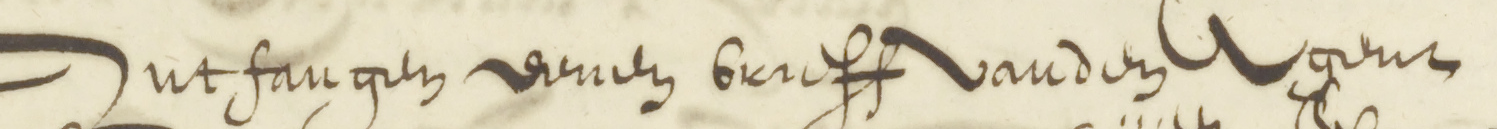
Ontfangen eenen brieff vanden Agent
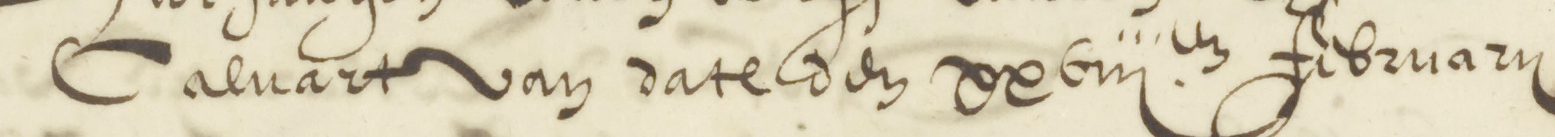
Caluart van date den xxviijen February
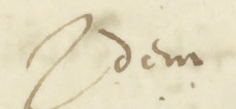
Idem.
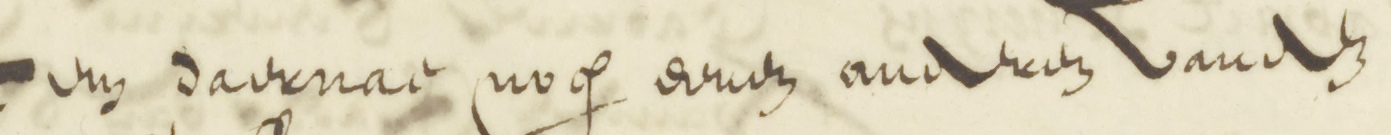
Item daernae noch eenen anderen vanden
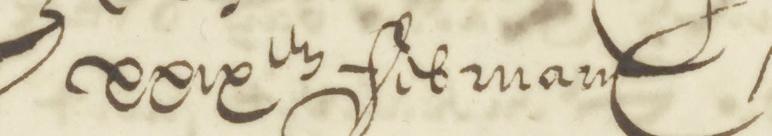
xxixen February
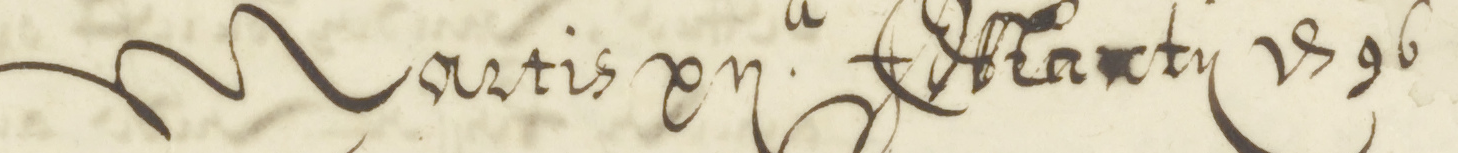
Martis xija. Marty 1596
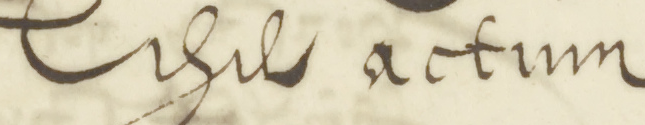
Nihil actum
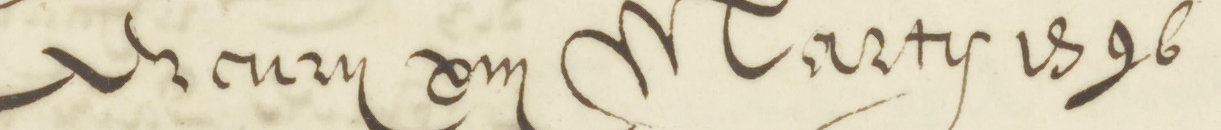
Mercury xiij Marty 1596
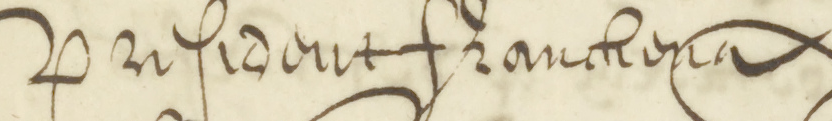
President Franckena
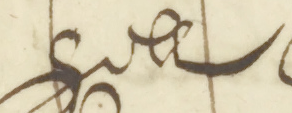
Hell
